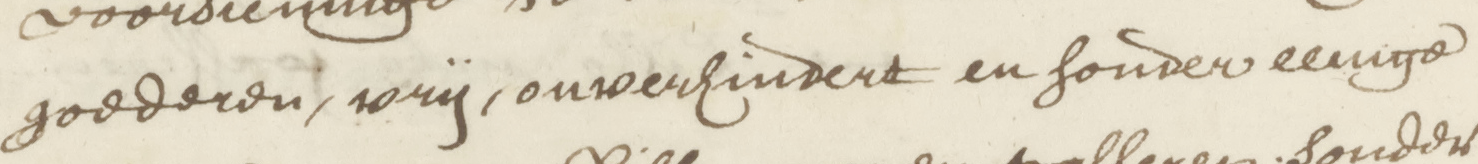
goederen, vrij, onverhindert en sonder eenige
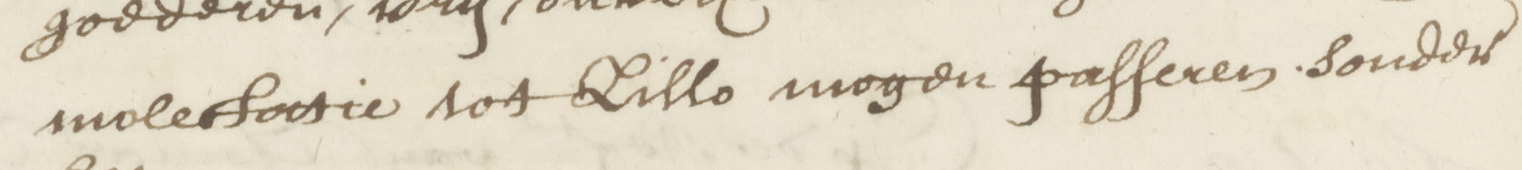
molestatie tot Lillo mogen passeren sonder
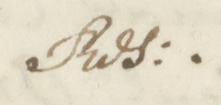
Res:
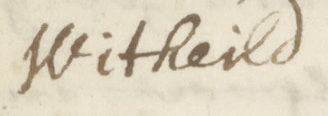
Witheild
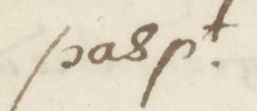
paspt.
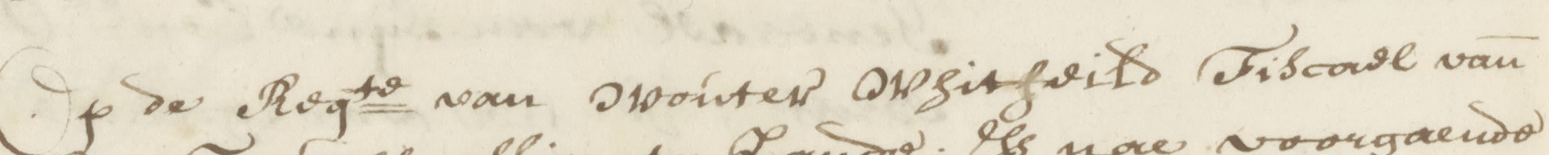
Op de Reqte van Wouter Whitheild Fiscael van
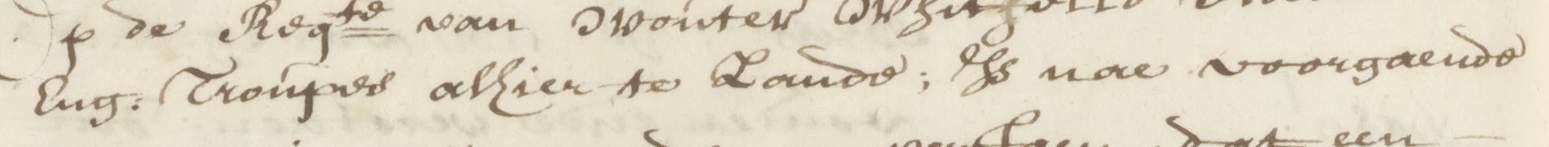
Eng: Troupes alhier te Lande: Is nae voorgaende
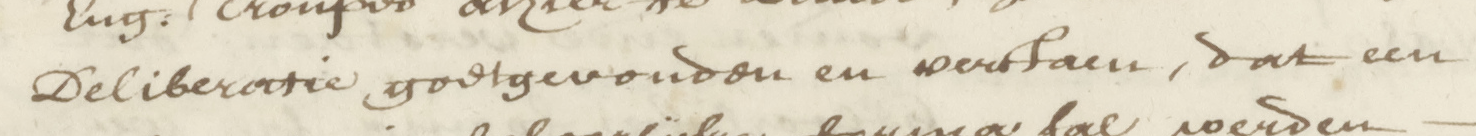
deliberatie goetgevonden en verstaen, dat een
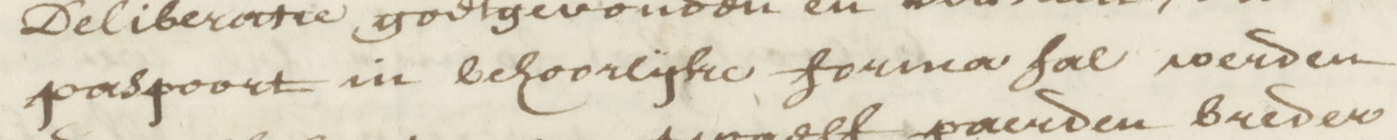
paspoort in behoorlijke forma sal werden
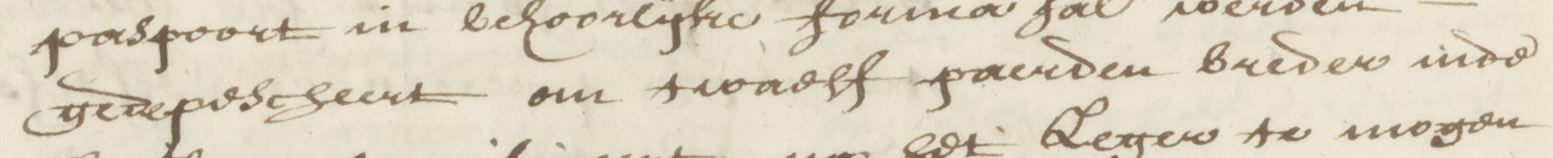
gedepescheert om twaeff paerden breder inde
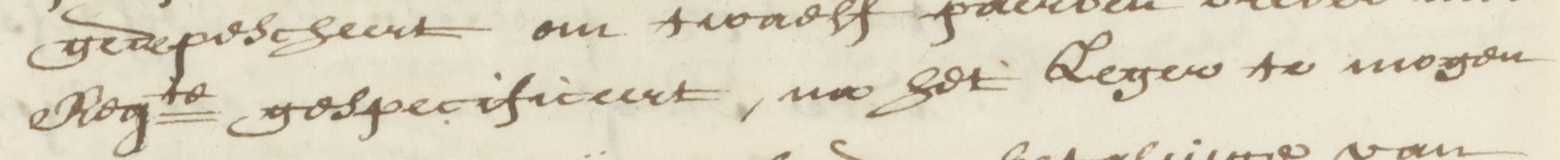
Reqte gespecificert, na het Leger te mogen
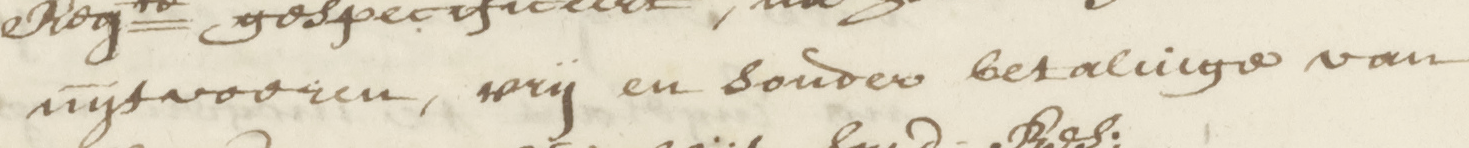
uijtvoeren, vrij en sonder betalinge van
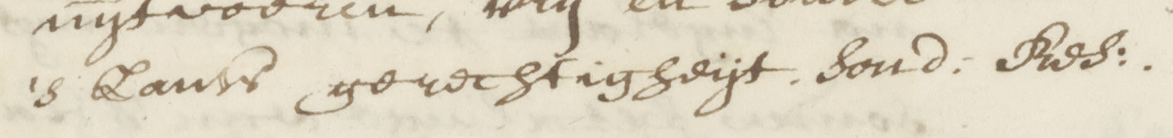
's Lants gerechtigheijt, sond: Res:
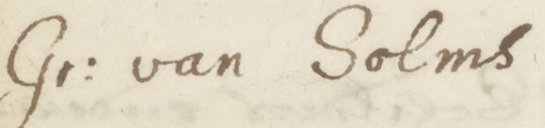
Gr: van Solms
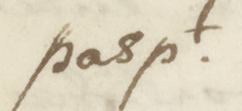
paspt
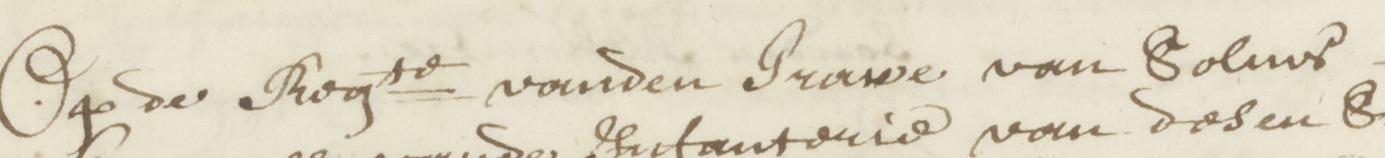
Op de Reqte vanden Grave van Solms
